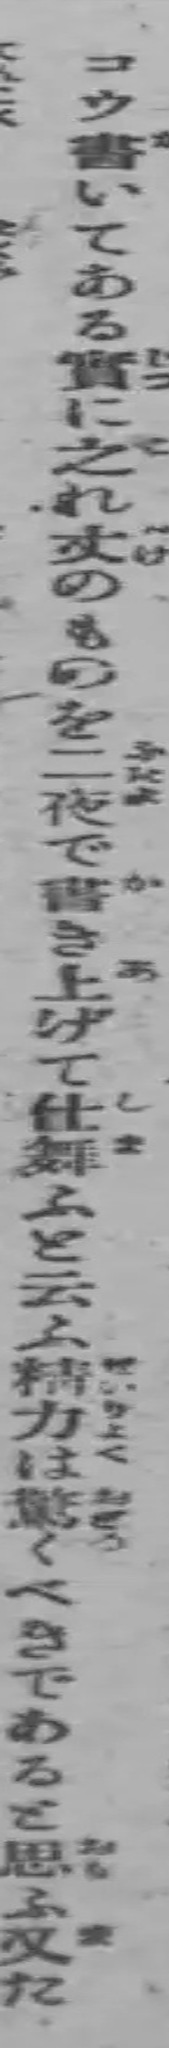コウ書いてある実に之れ丈のものを二夜で書き上げて仕舞ふと云ふ精力は驚くべきであると思ふ又た
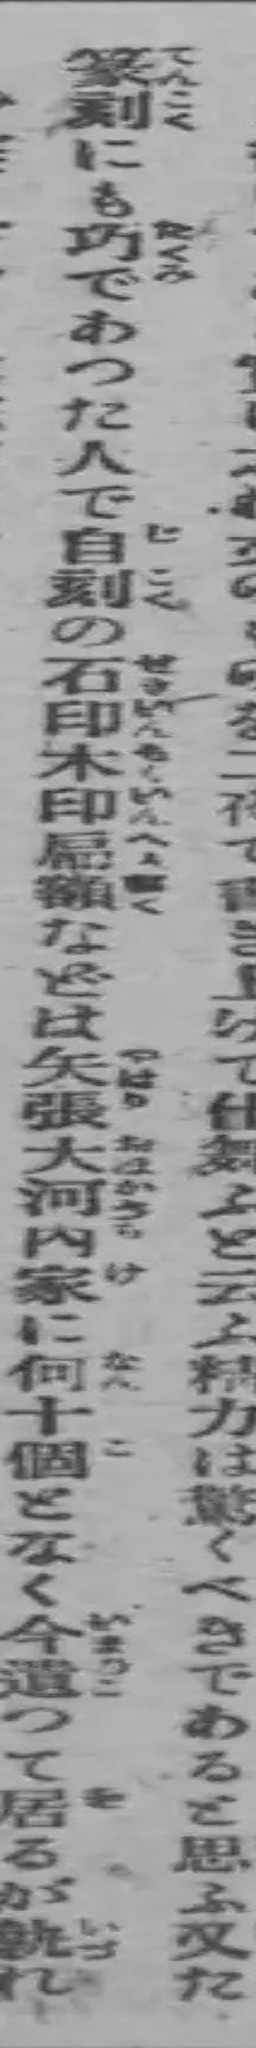篆刻にも巧であつた人で自刻の石印木印扁額などは矢張大河内家に何十個となく今遺つて居るが孰れ
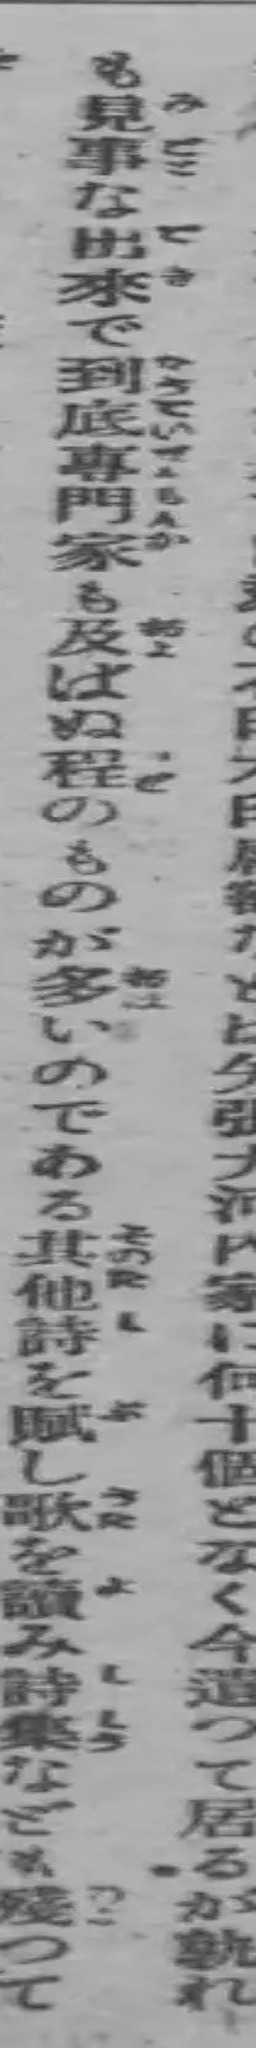も見事な出来で到底専門家も及ばぬ程のものが多いのである其他詩を賦し歌を読み詩集なども残つて
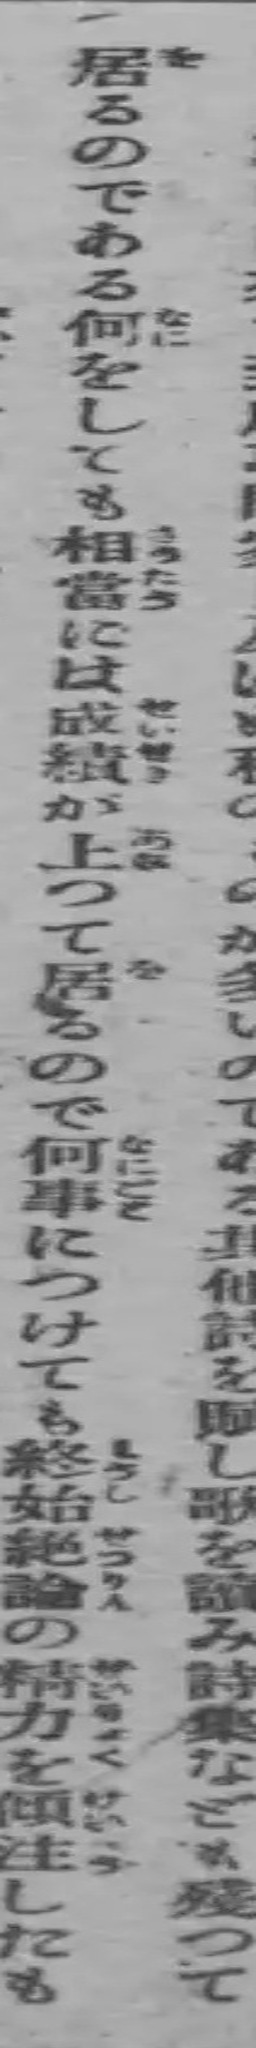居るのである何をしても相当には成績が上つて居るので何事につけても終始絶倫の精力を傾注したも
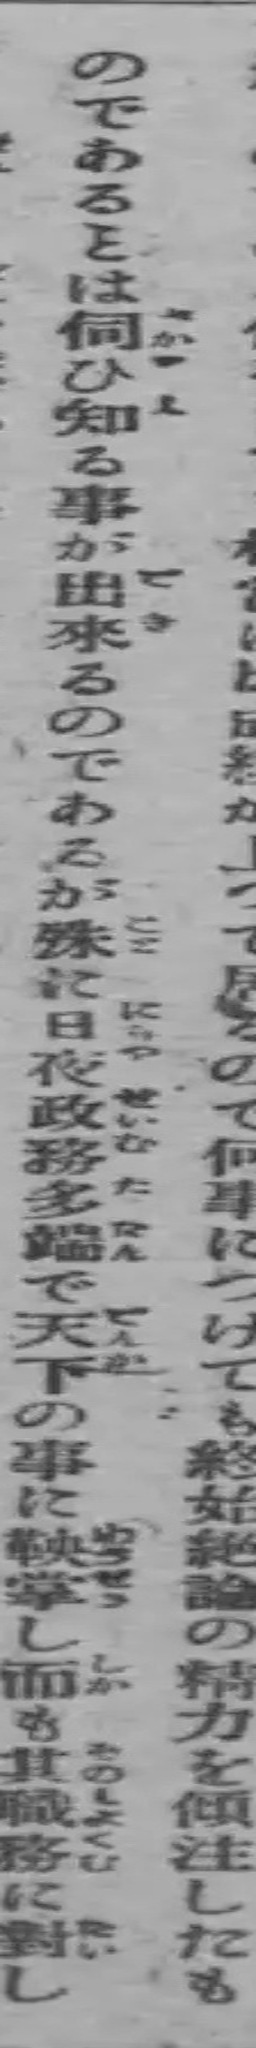のであることは伺ひ知る事が出来るのであるが殊に日夜政務多端で天下の事に鞅掌し而も其職務に対し
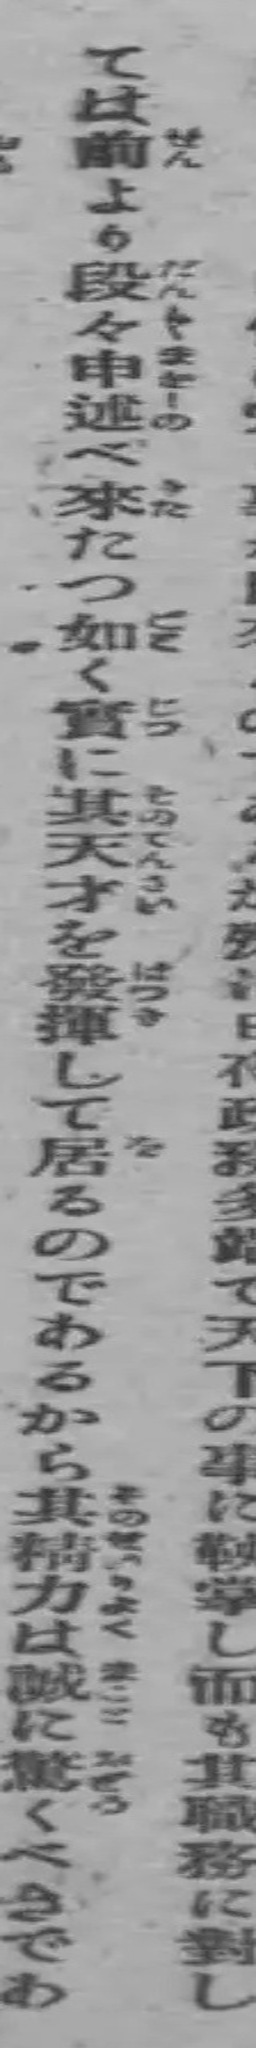ては前より段々申述べ来つた如く実に其天才を発揮して居るのであるから其精力は誠に驚くべきであ
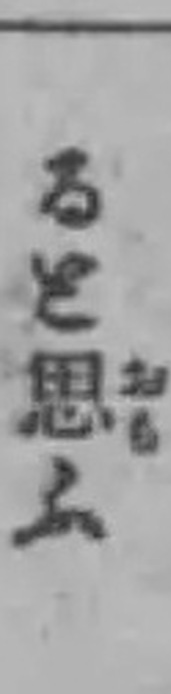ると思ふ
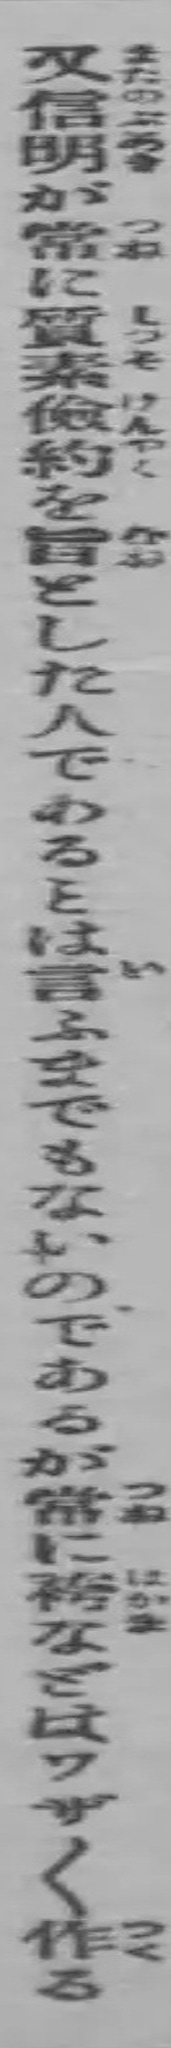信明の質素又信明が常に質素倹約を旨とした人であることは言ふまでもないのであるが常に袴などはワザ〳〵作る
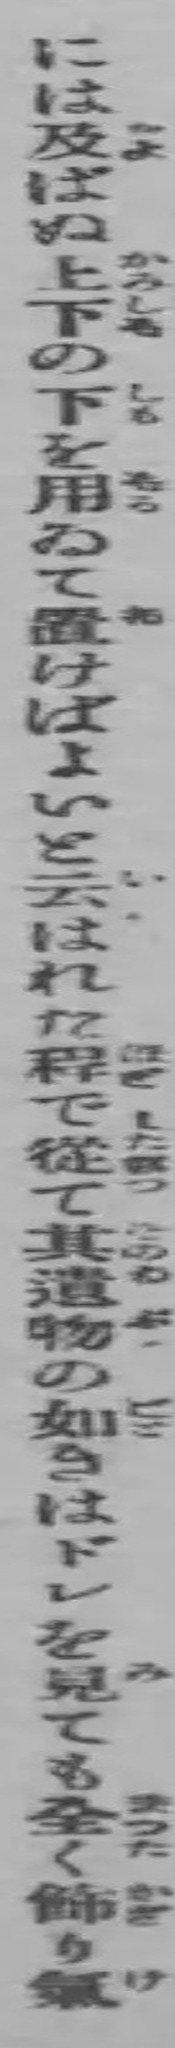には及ばぬ上下の下を用ゐて置けばよいと云はれた程で従て其遺物の如きはドレを見ても全く飾り気
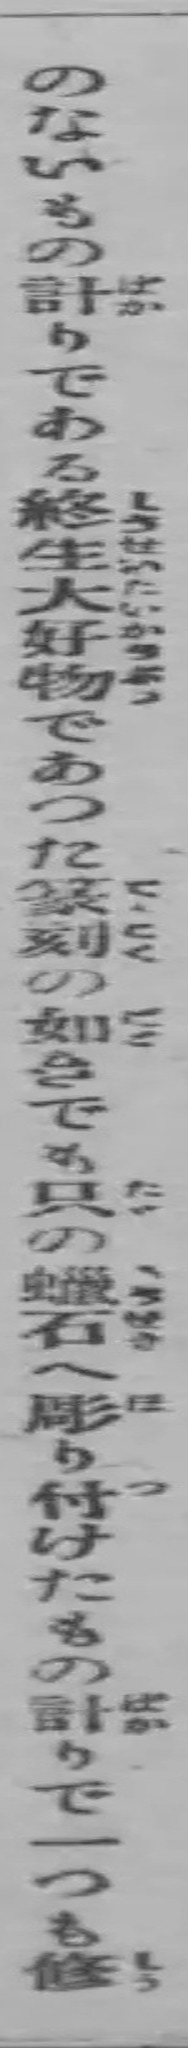のないもの計りである終生大好物であつた篆刻の如きでも只の蠟石へ彫り付けたもの計りで一つも修
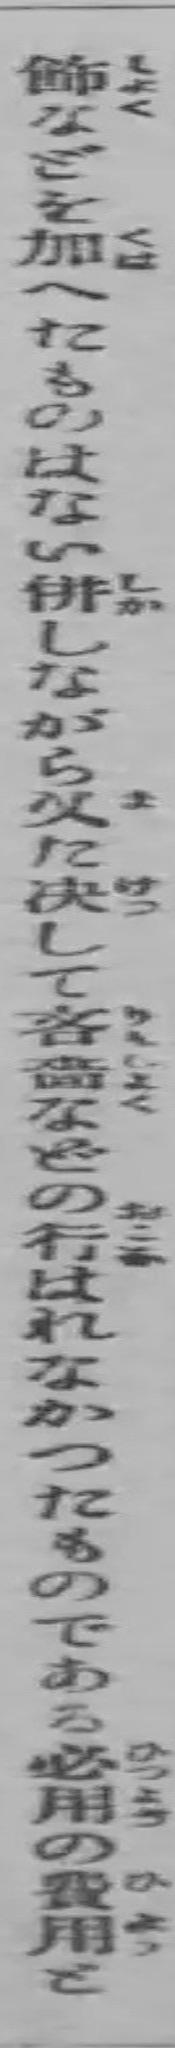飾などを加へたものはない併しながら又た決して吝嗇などの行はれなかつたものである必用の費用と
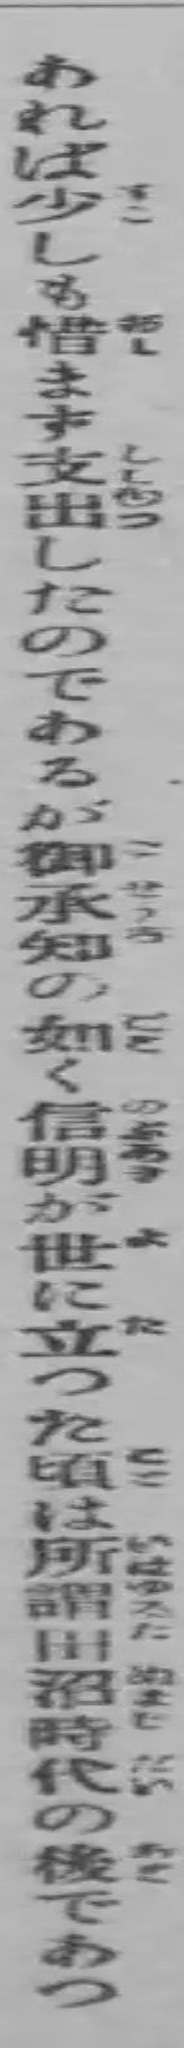あれば少しも惜まず支出したのであるが御承知の如く信明が世に立つた頃は所謂田沼時代の後であつ
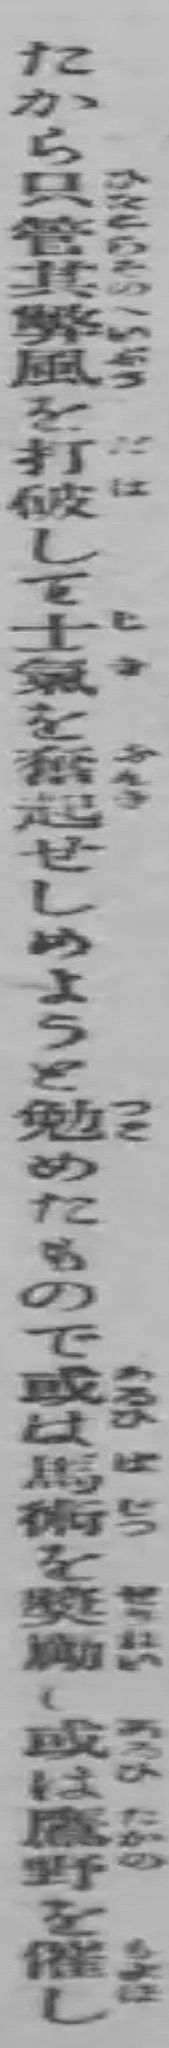たから只管其弊風を打破して士気を奮起せしめようと勉めたもので或は馬術を奨励し或は鷹野を催し
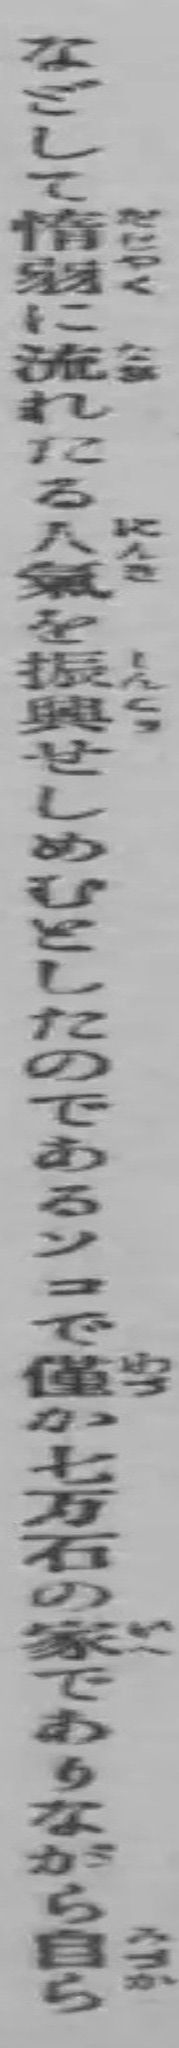などして惰弱に流れたる人気を振興せしめむとしたのであるソコで僅か七万石の家でありながら自ら
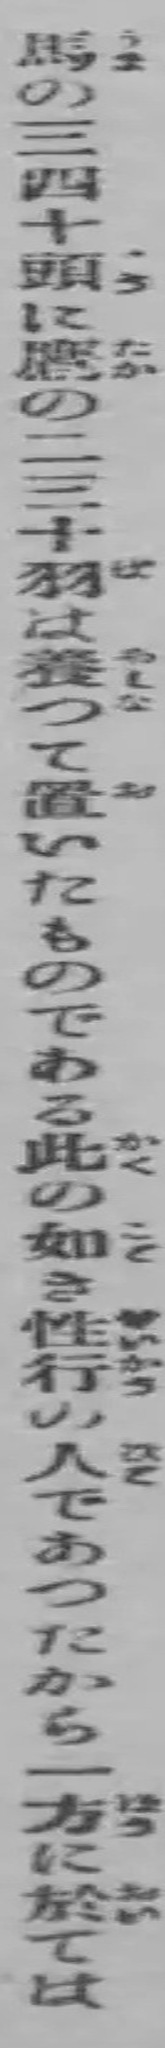馬三四十頭に鷹の二三十羽は養つて置いたものである此の如き性行の人であつたから一方に於ては
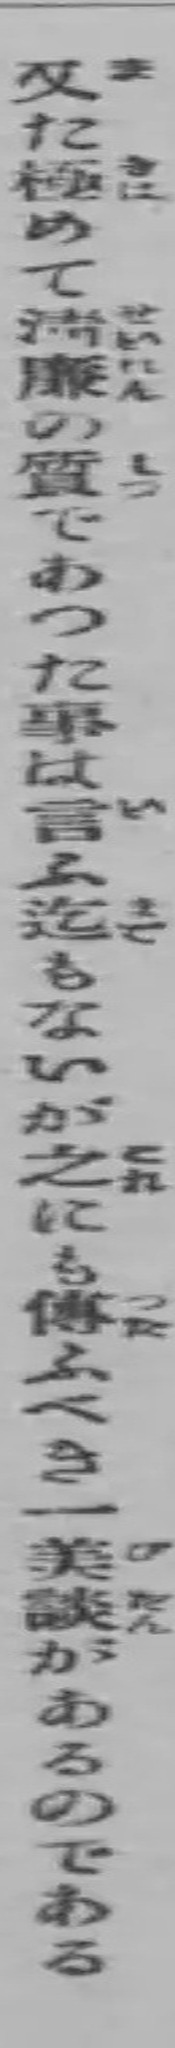又た極めて清廉の質であつた事は言ふ迄もないが之にも伝ふべき一美談があるのである
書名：豊橋市史談
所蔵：国立国会図書館 National Diet Library, JAPAN
